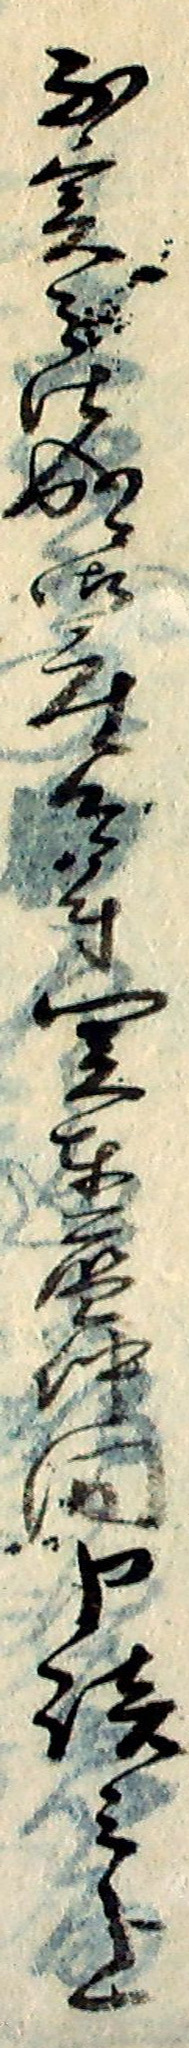不実之仕成に御座候に付関東藍仲間申談之上
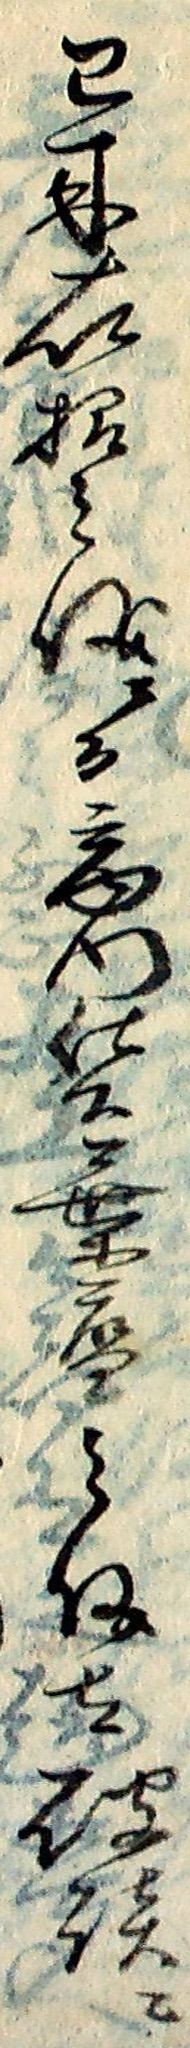已来右様之儀にて商内仕候葉藍之儀は破談に
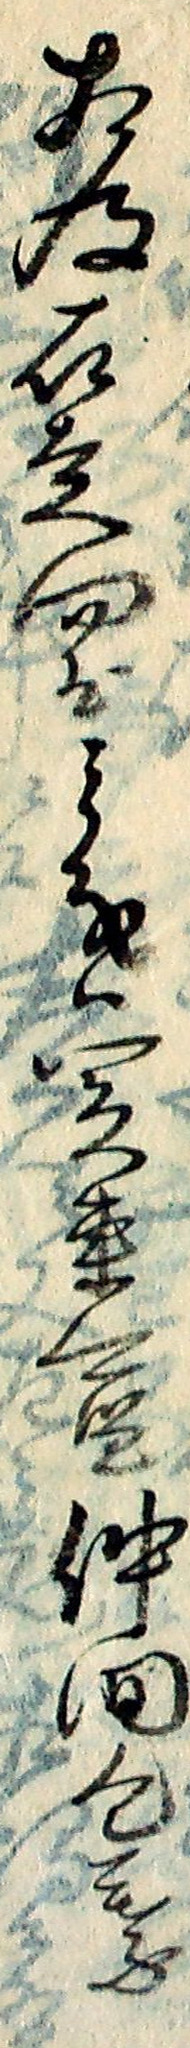相及右走問屋之儀は関東藍仲間包葉
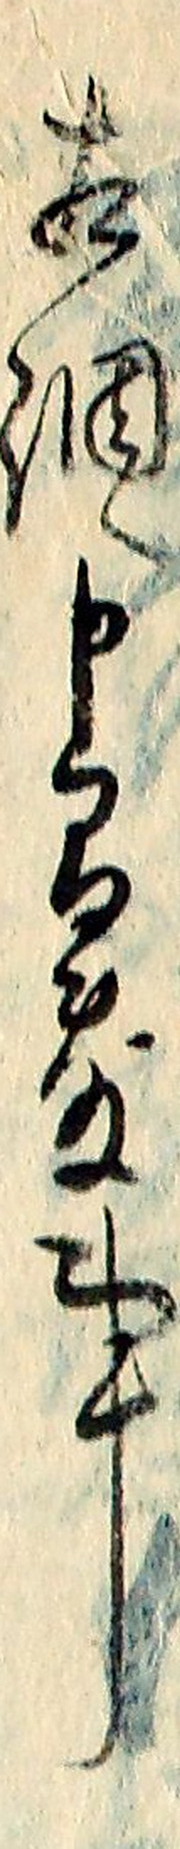相調へ申間敷事
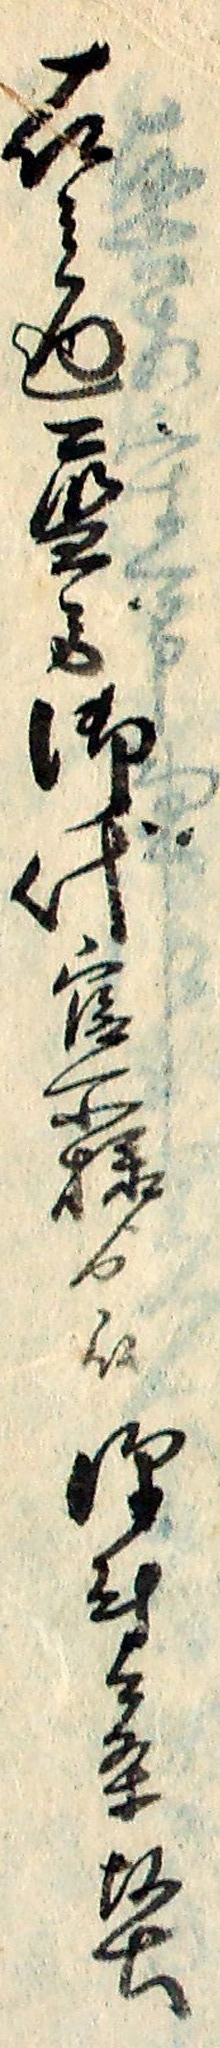右之通藍方御代官所様ゟ被仰付候条堅
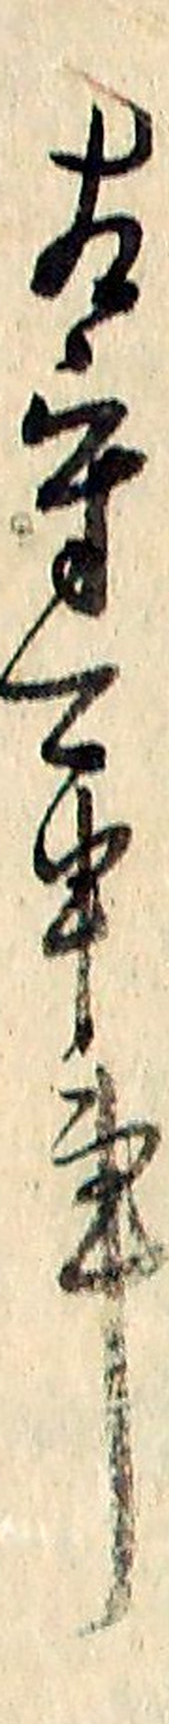相守可申事

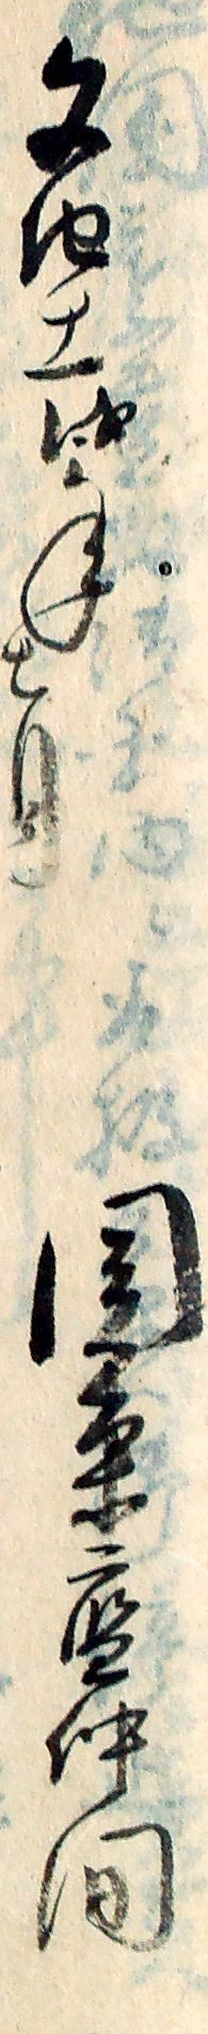文化十一戌年七月関東藍仲間
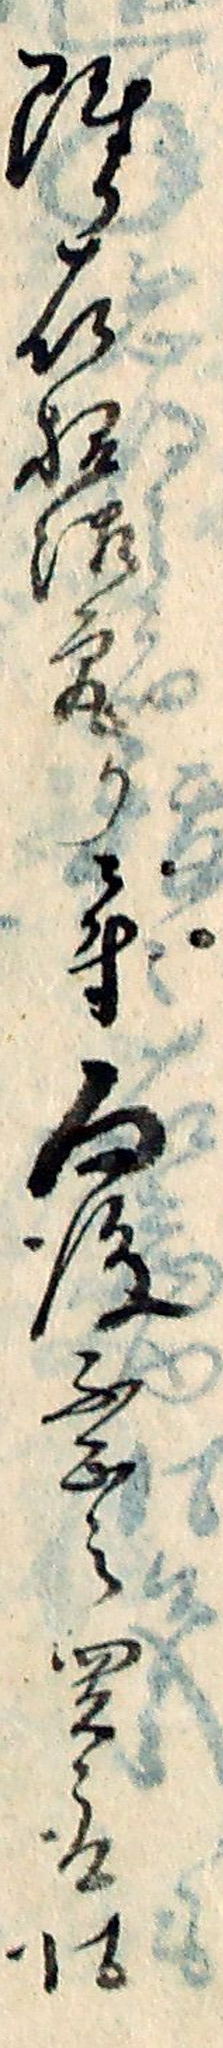附り右様御究りに付向後不正之買取仕
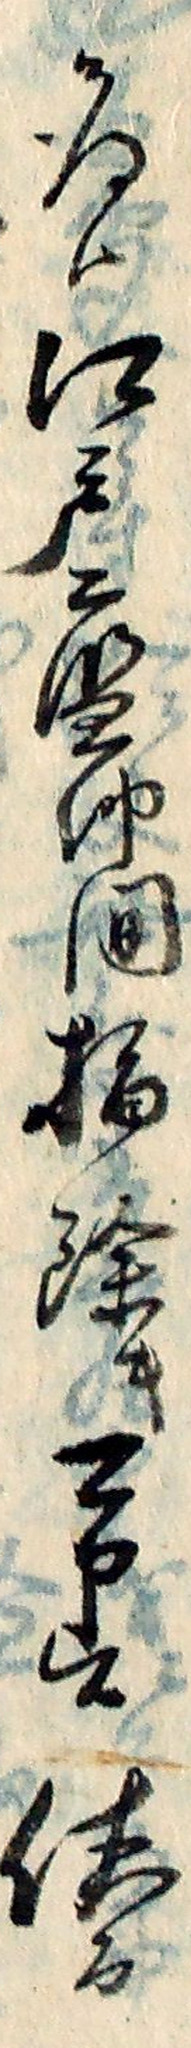候得は江戸藍仲間指除き可申候依て
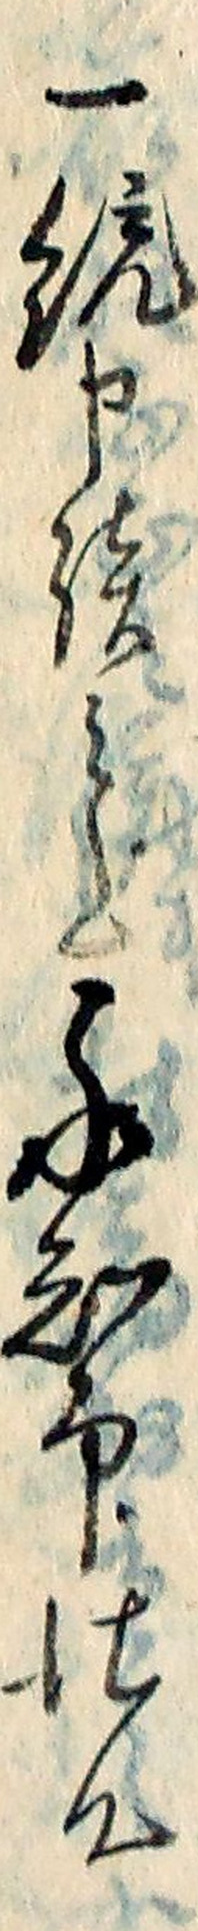一統申談之上承知印仕候
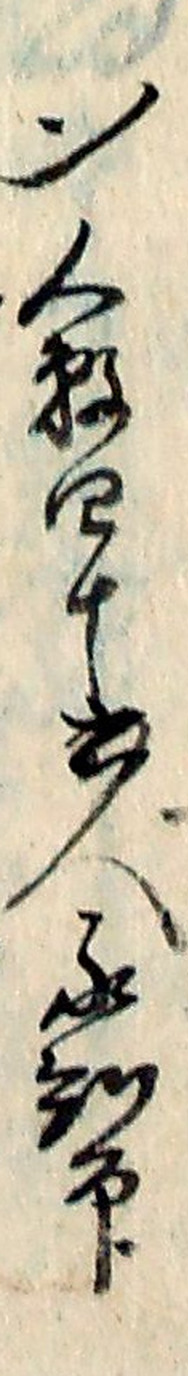〆人数四十六人承知印
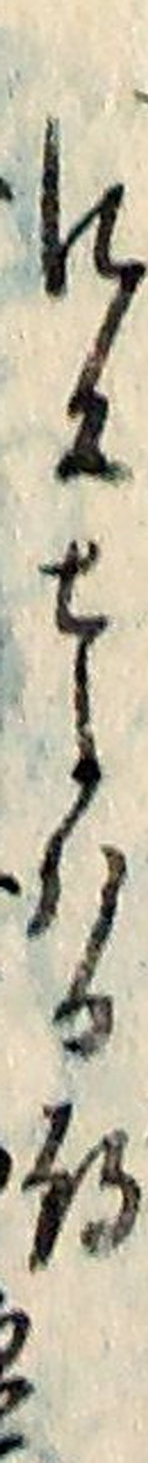仕候七月八日朝
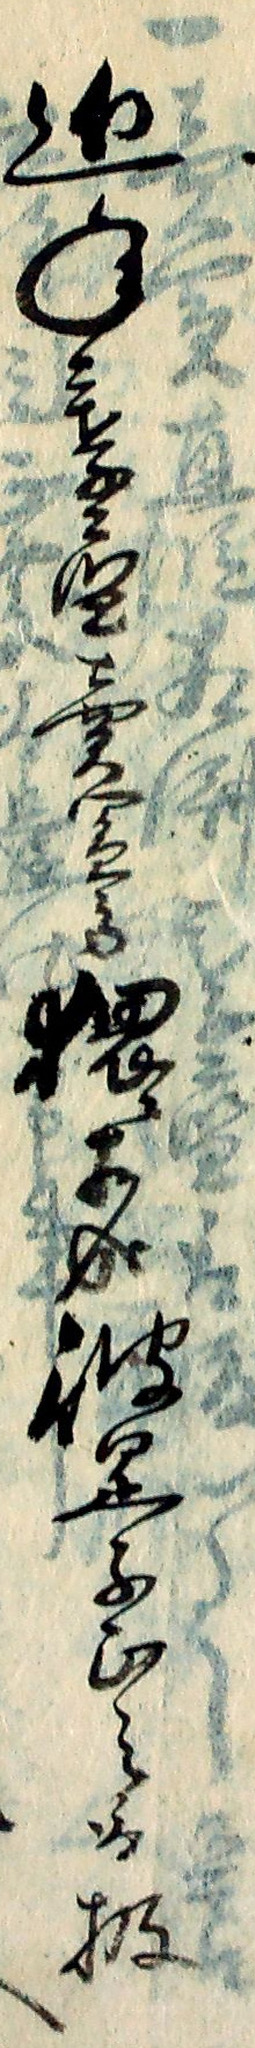近年葉藍売買方猥に相成彼是不正之取扱
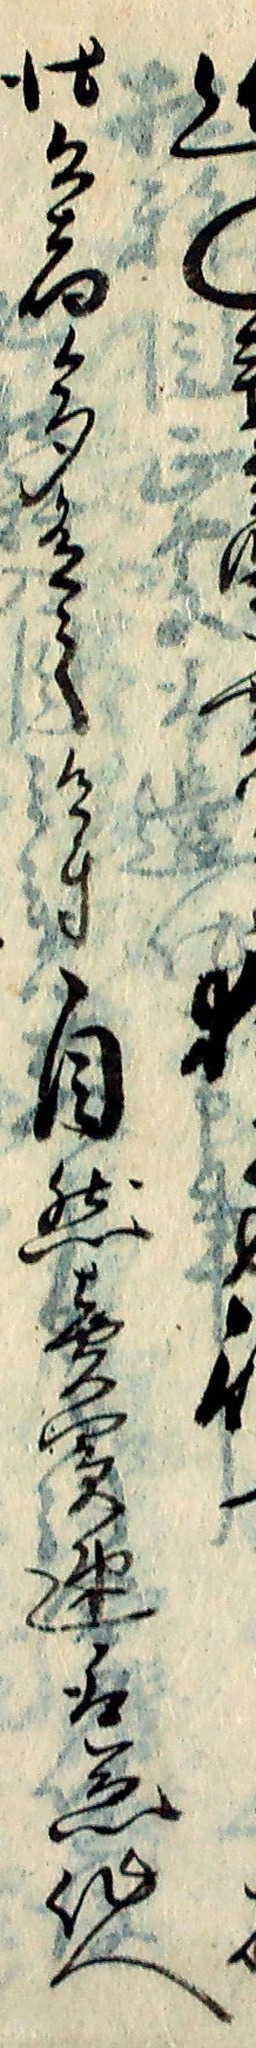仕候者多有之候に付自然売買速取兼作人
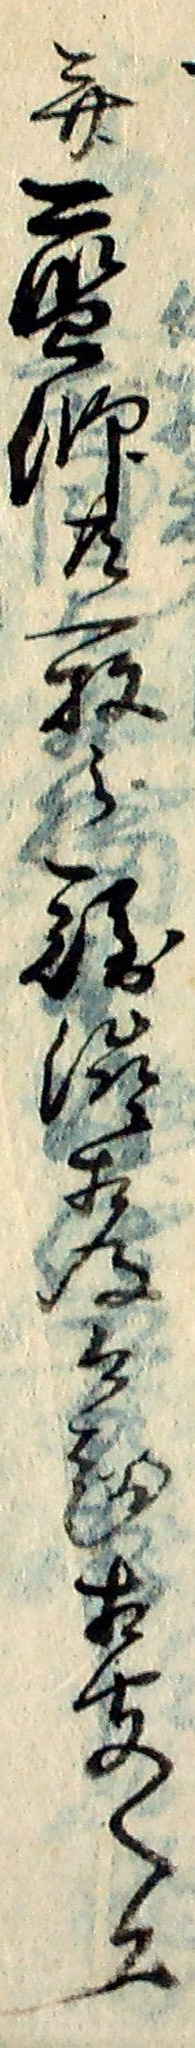并藍師共一般之難渋に相及候趣相聞へ候
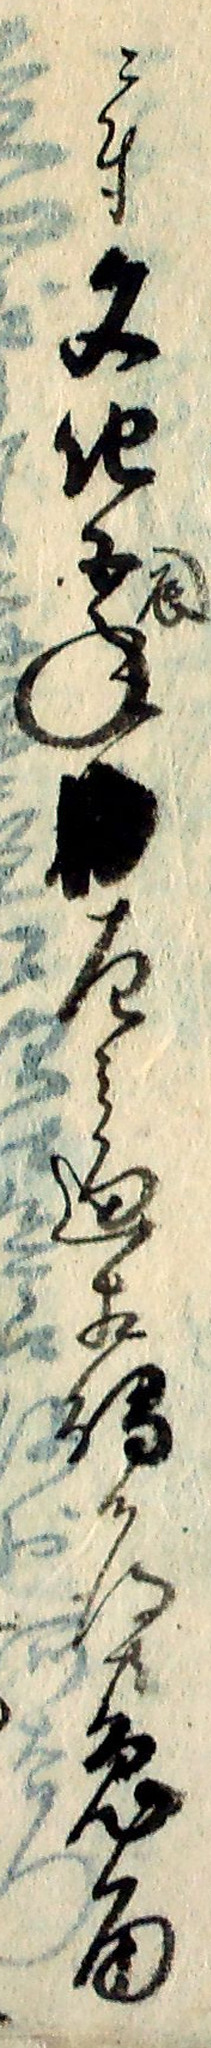に付文化五辰年左之通相触候得共兎角
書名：諸御願書控(後藤氏壱番）
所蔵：鳴門教育大学 Naruto University of Education
